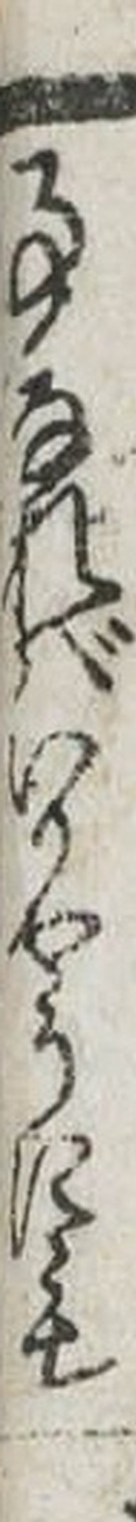事なればいかやうにも
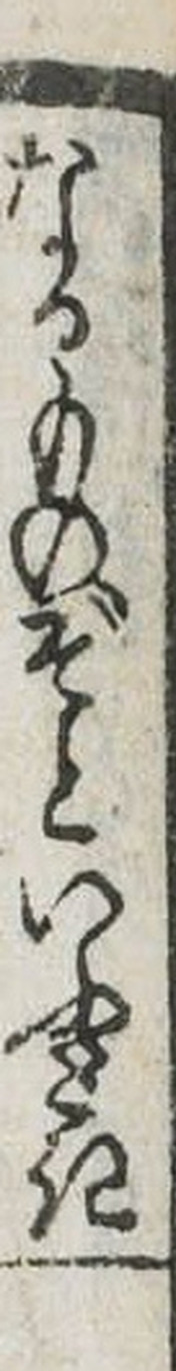なるものぞといふとき
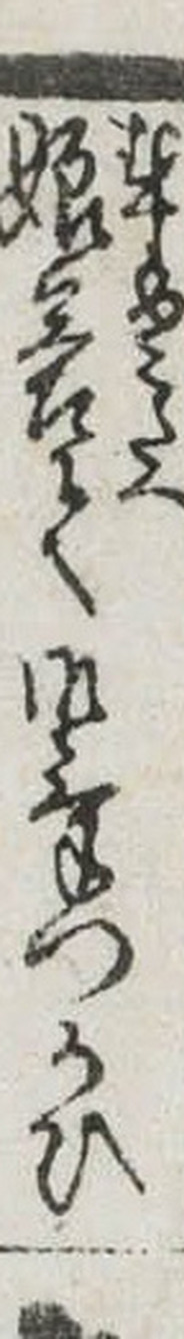娘答て御気つかひ
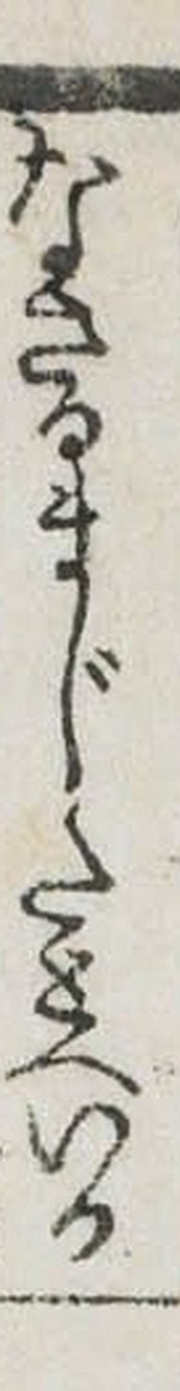なさるまじたとへいか
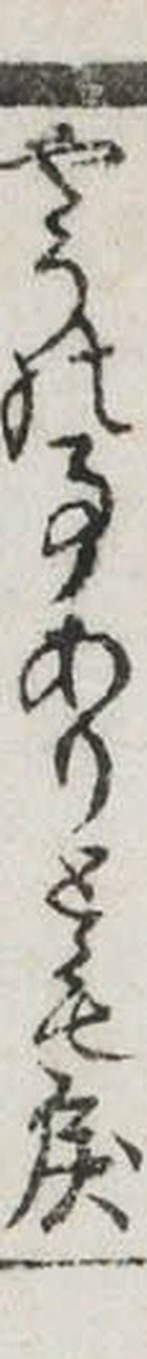やうの事ありとも戻
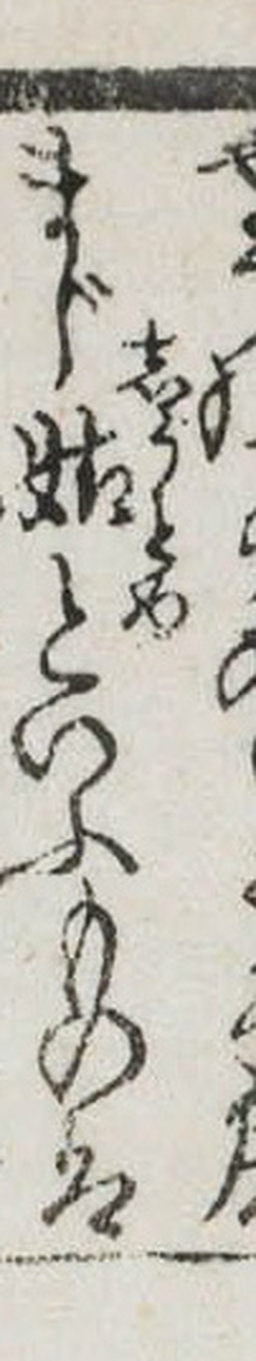まじ姑といふものは
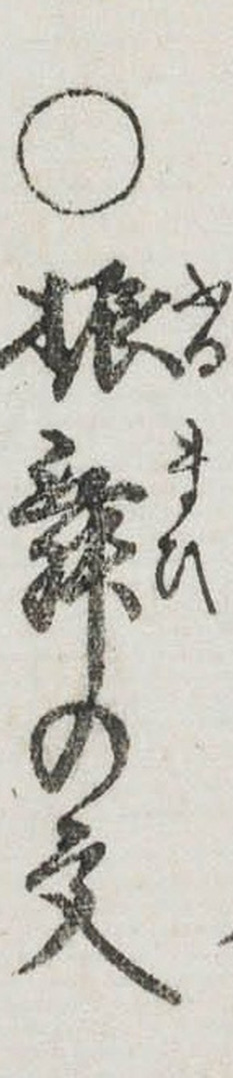○振舞の文
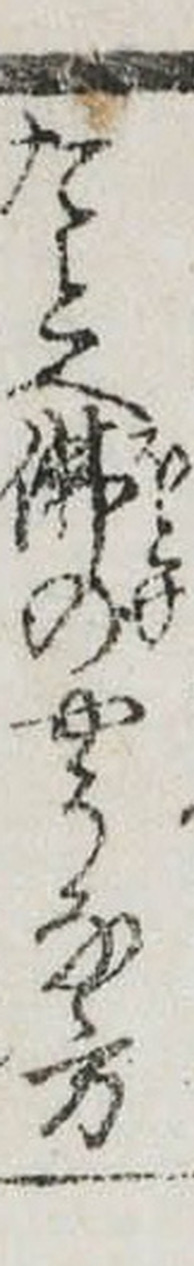たとへ仏のやうな方
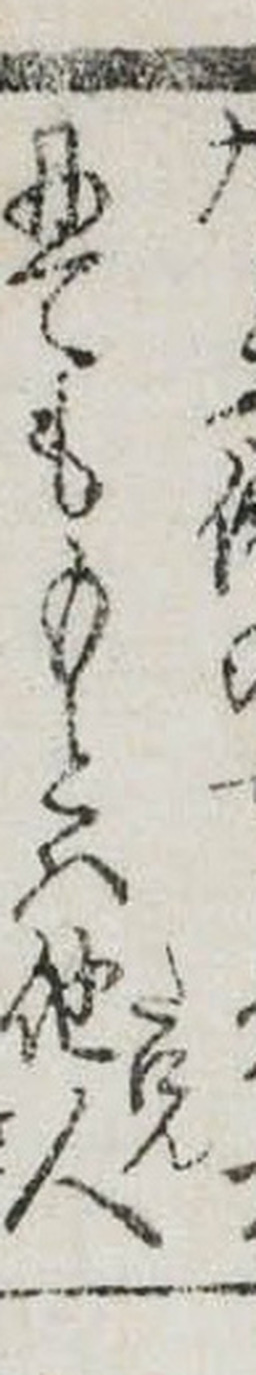にてももとは他人
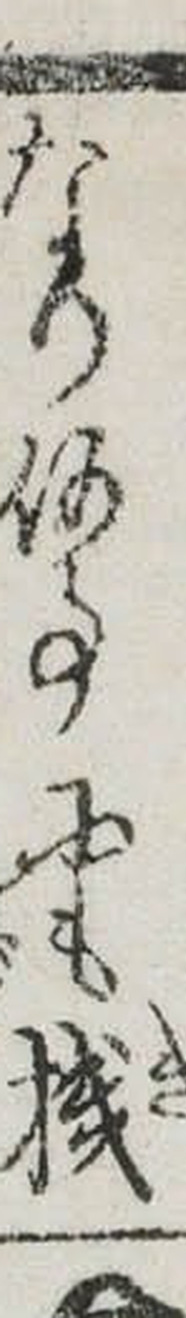なり何事にも機
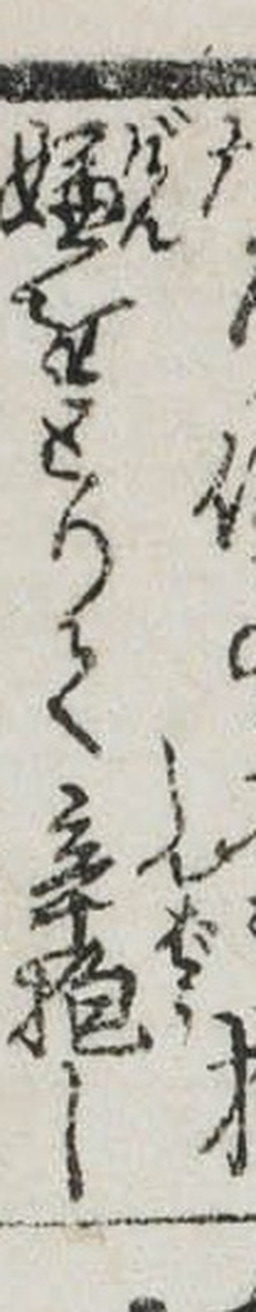嫌をとりて辛抱し
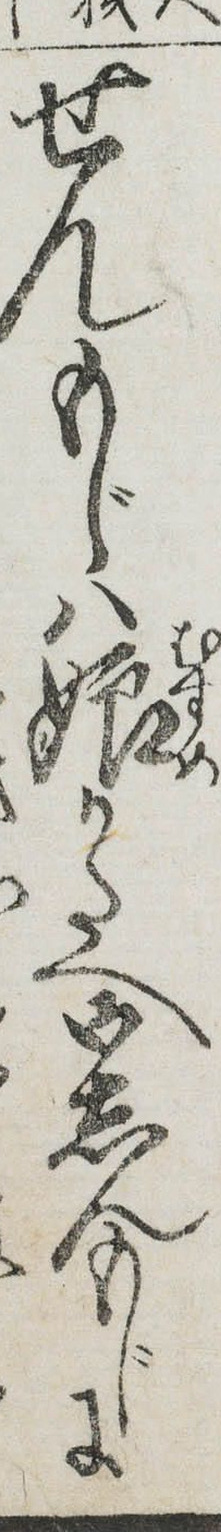せんもじは娘かたへ御しんもじに
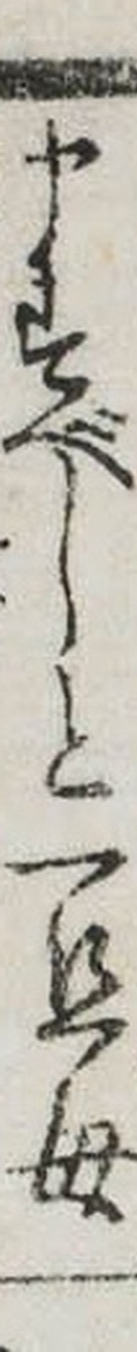申すべしと一旦母
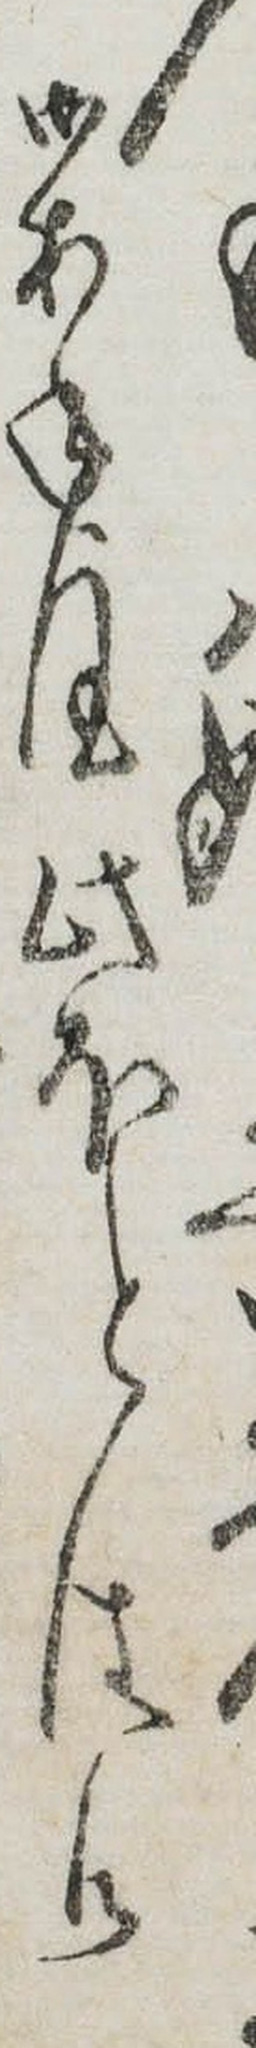御あねさま此ほとは御
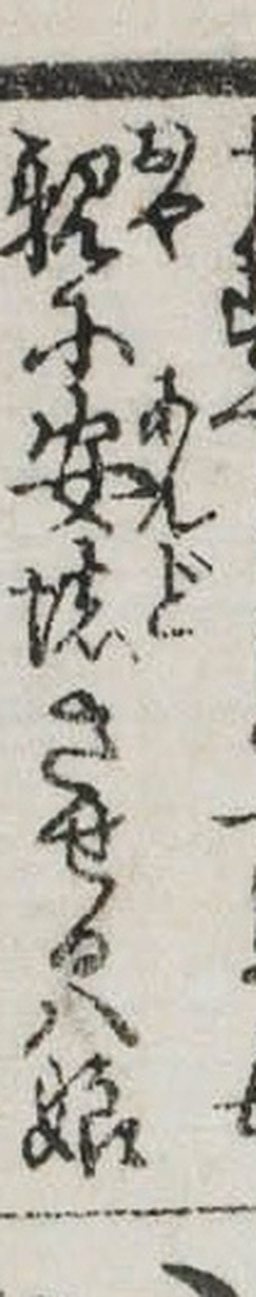親に安堵させるは娘
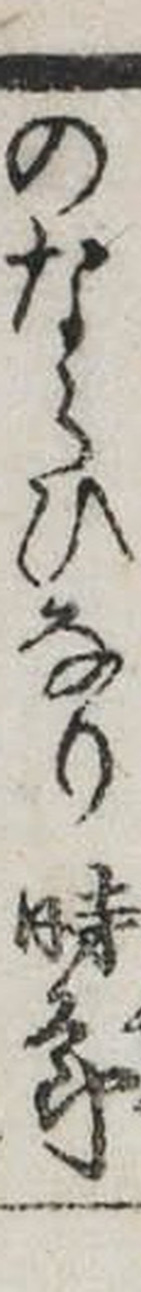のならひなり時節
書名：頭書萬用婦人手紙之文言
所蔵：東京学芸大学教育コンテンツアーカイブ
